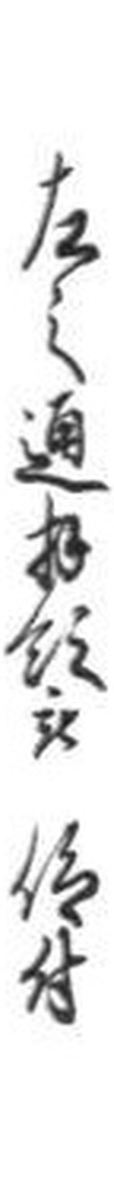左之通拝領被仰付

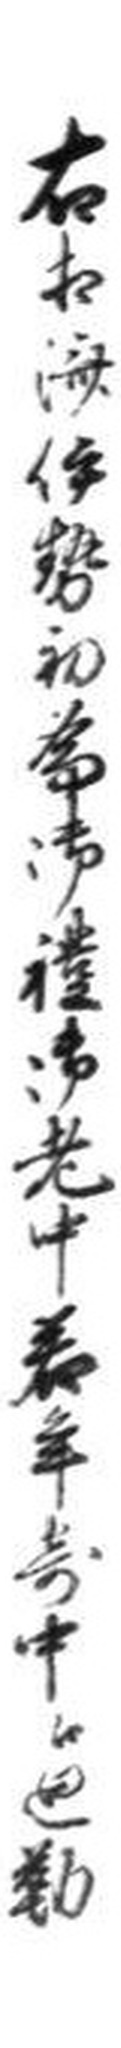右相済伊勢初為御礼御老中若年寄中江廻勤
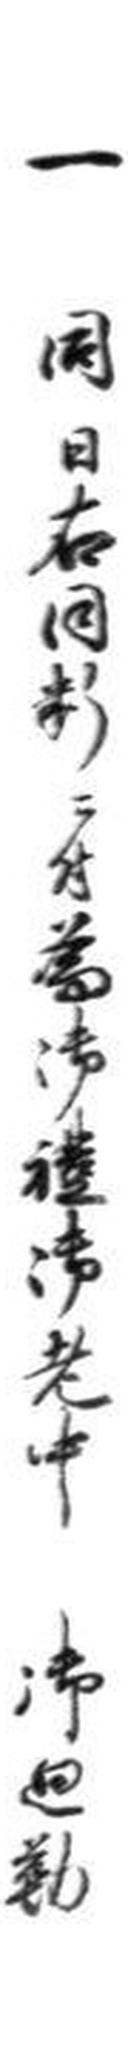一同日右同断ニ付為御礼御老中御廻勤
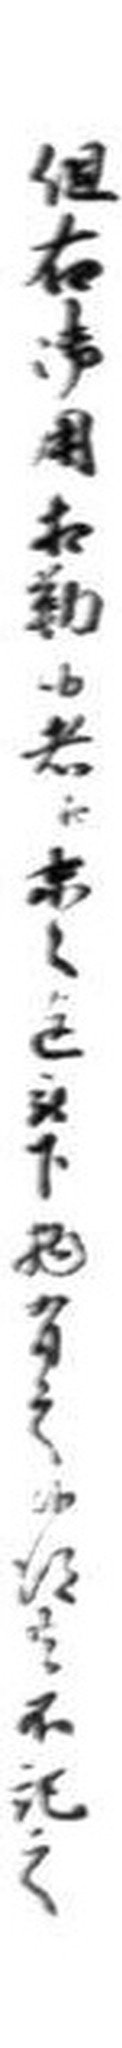但右御用相勤候者江末々迄被下物有之候得共不記之
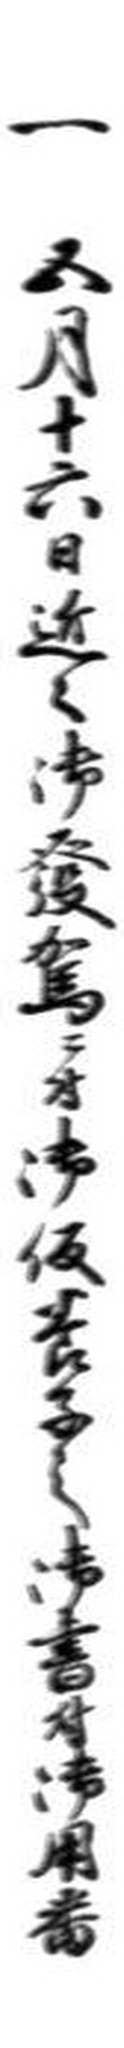一五月十六日近々御発駕ニ付御仮養子之御書付御用番
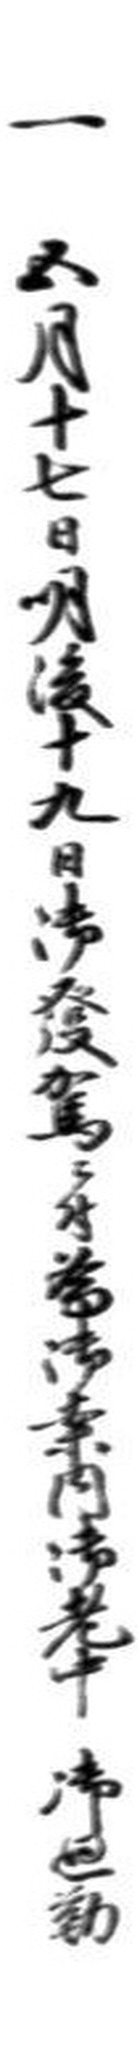一五月十七日明後十九日御発駕ニ付為御案内御老中御廻勤
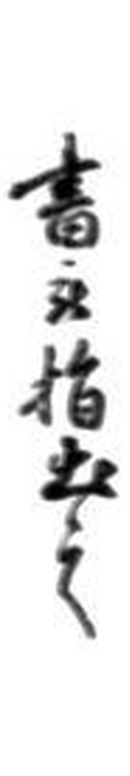書被指出之

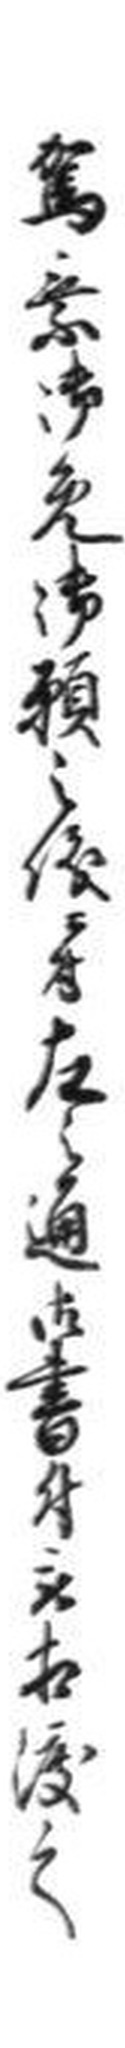駕乗御免御願之儀ニ付左之通御書付被相渡之
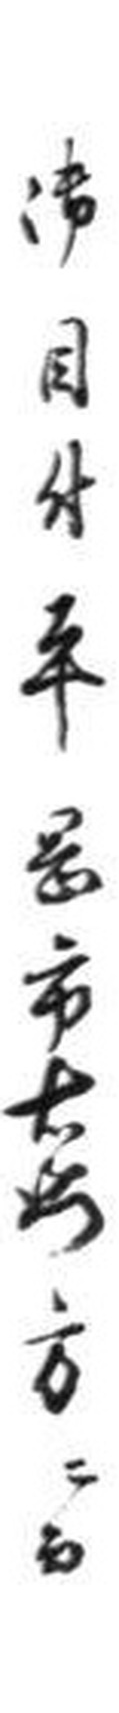御目付平岡市右衛門方ニ而
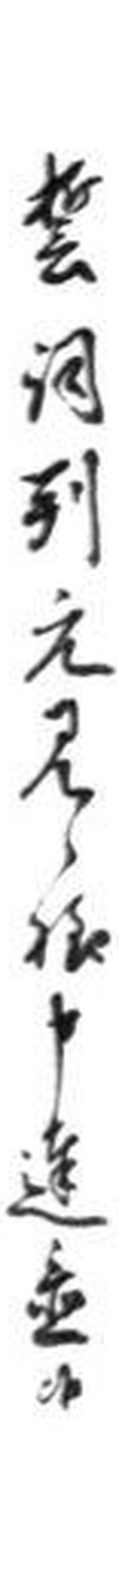誓詞判元見候様申達置候
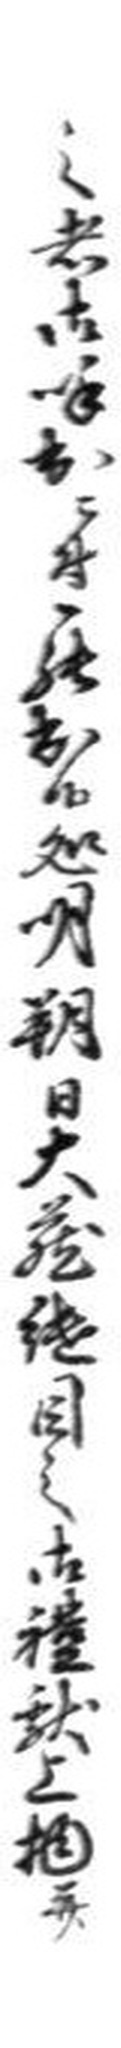之者御呼出ニ付罷出候処明朔日大蔵継目之御礼献上物并
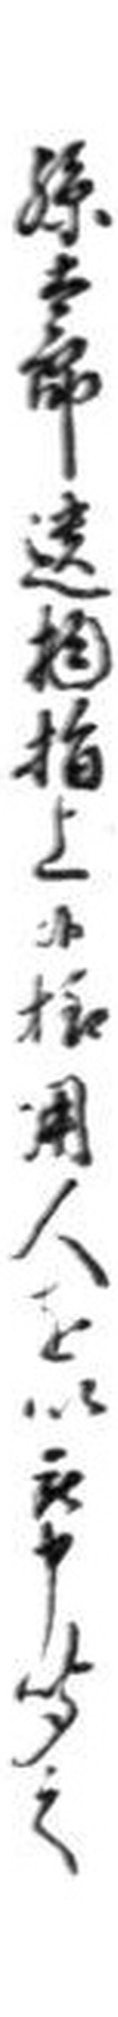孫太郎遺物指上候様用人を以被申聞之
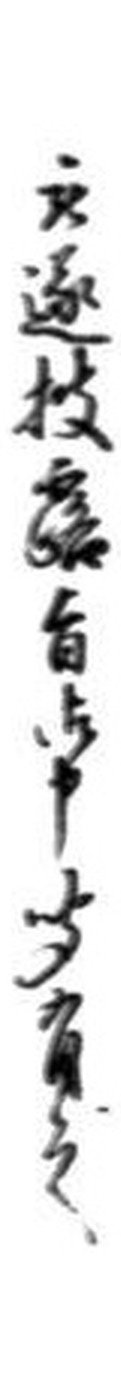被遂披露旨御申聞有之
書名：家譜 三十二 吉邦公 従享保二年到享保三年
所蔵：福井県文書館 Fukui Prefectural Archives
